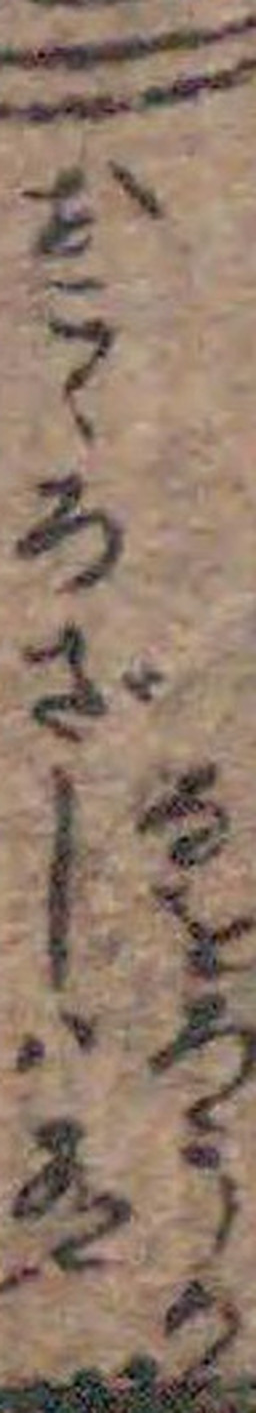おこゝろざしは有
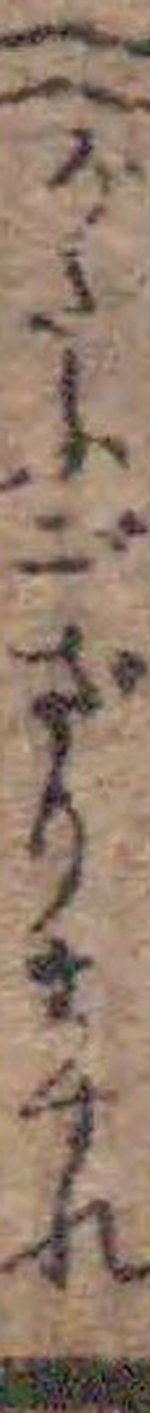がたふござりますれ
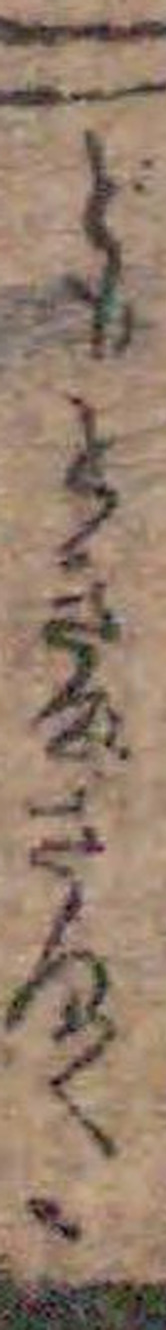どもときまささまへ
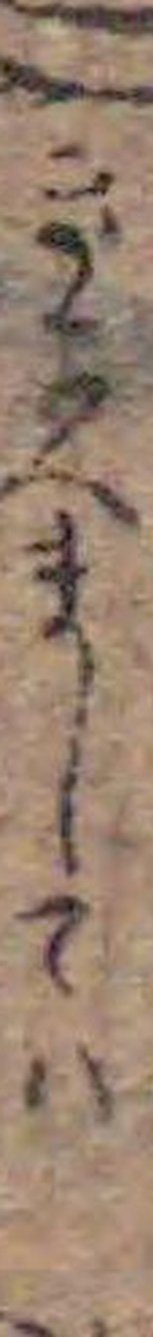きこへましては
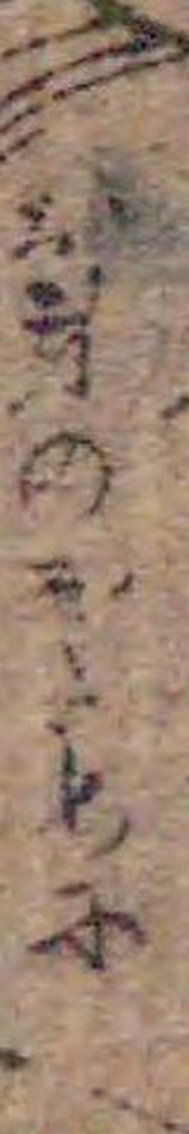お身のおために
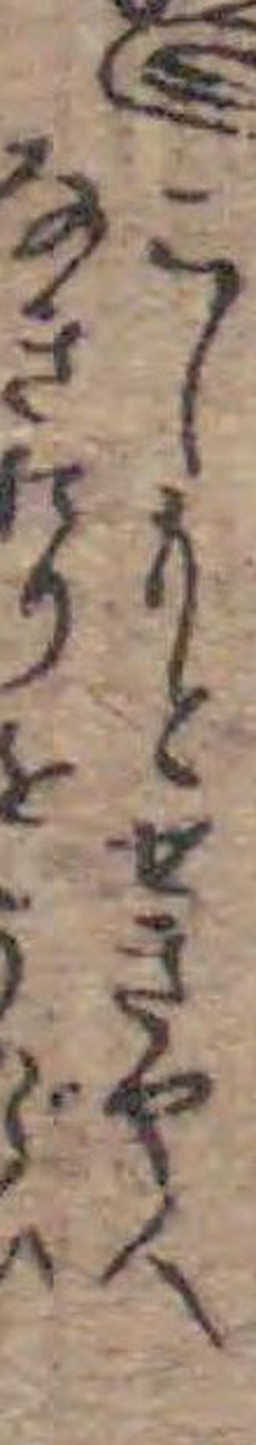なきおりをうかゞひ
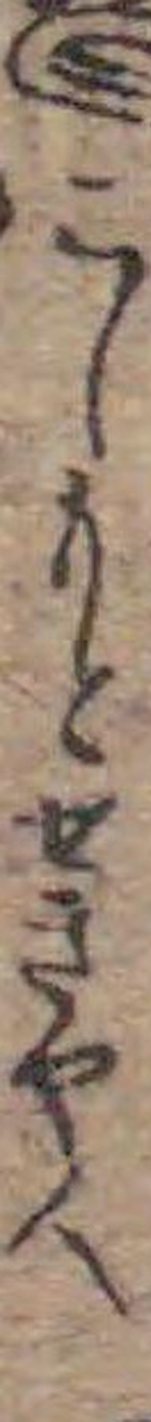こしもとせきや人
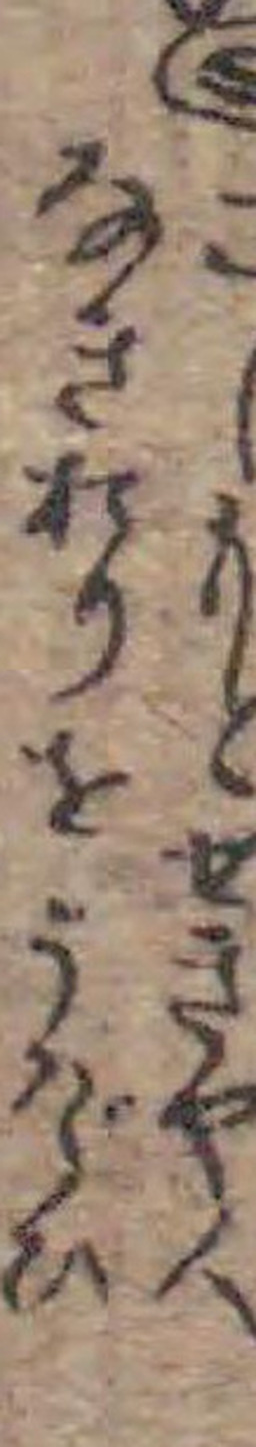なきおりをうかゞひ
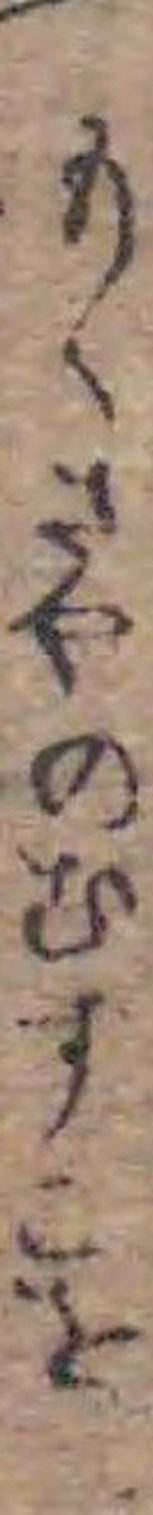もくさやのむすこを
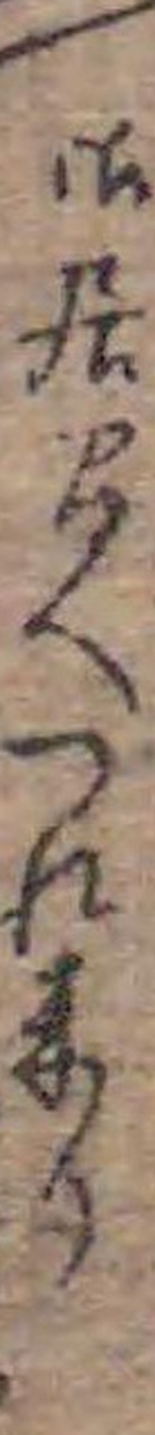御居間へつれ来り
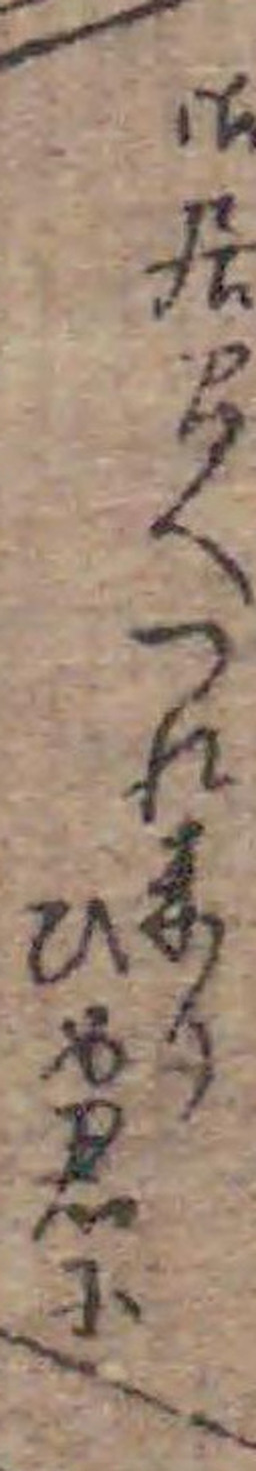ひめ君に
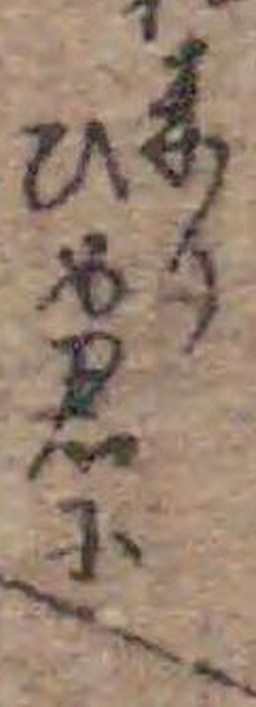ひめ君に
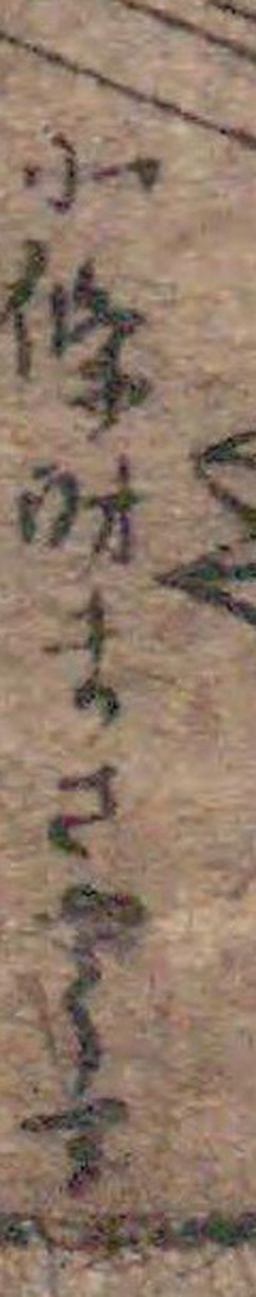北条時まさやうす
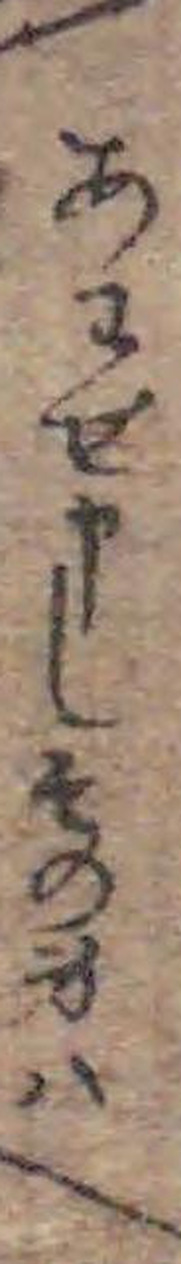あわせ申しその身は
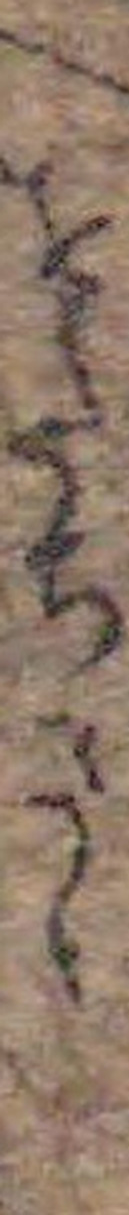をたちきゝ
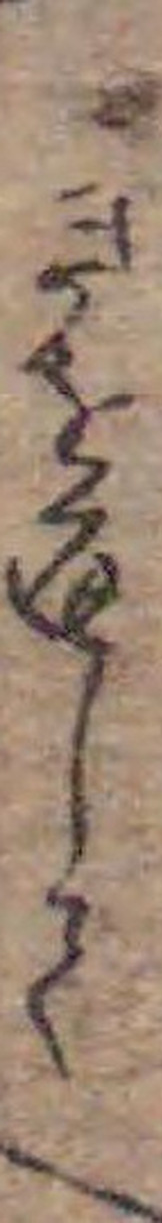きを通して
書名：三舛増鱗組 : 3巻
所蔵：国立国会図書館 National Diet Library, JAPAN
